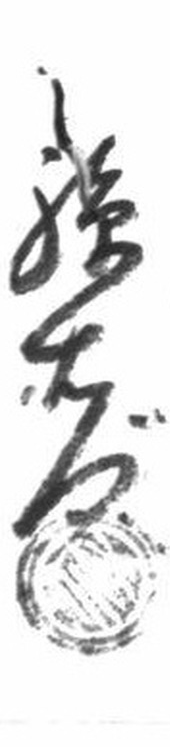孫右衛門
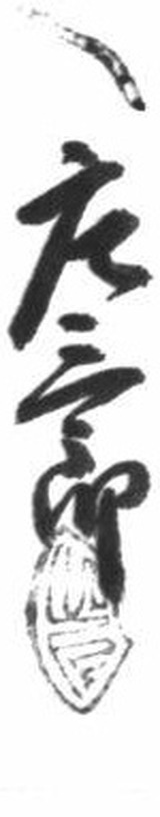庄三郎
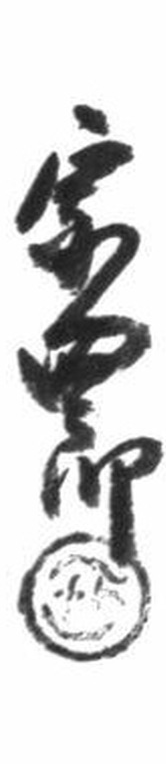宗四郎
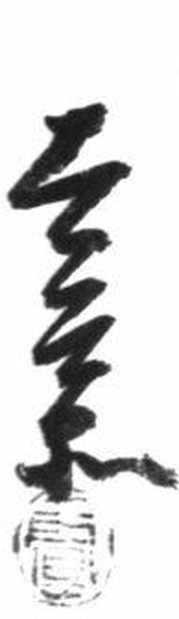喜兵衛
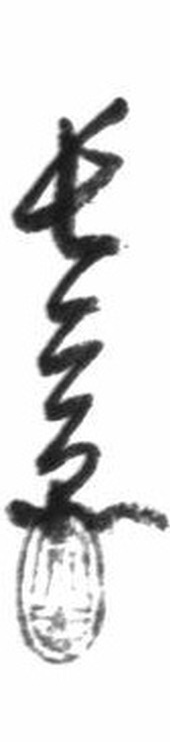長兵衛
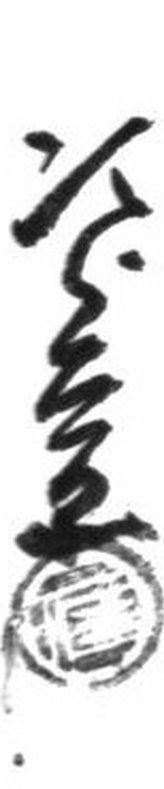次郎兵衛
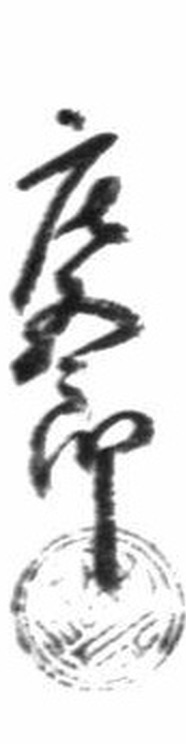庄五郎
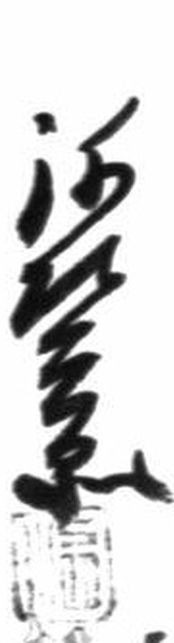弥次兵衛
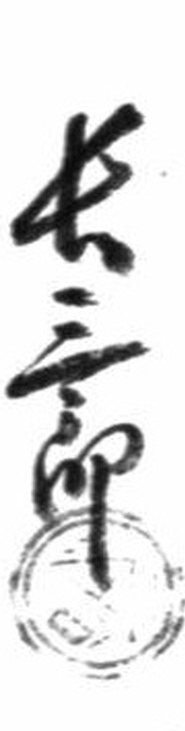長三郎
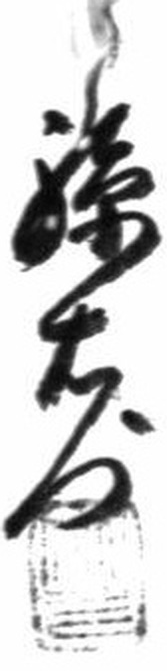孫右衛門
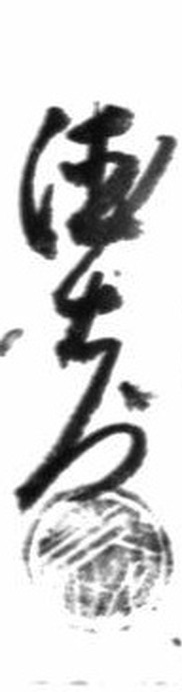徳右衛門
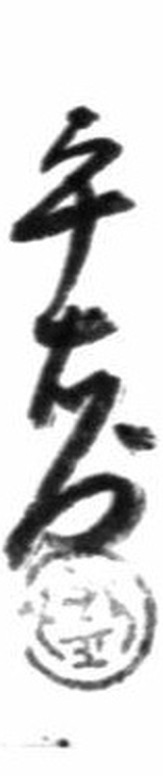平右衛門

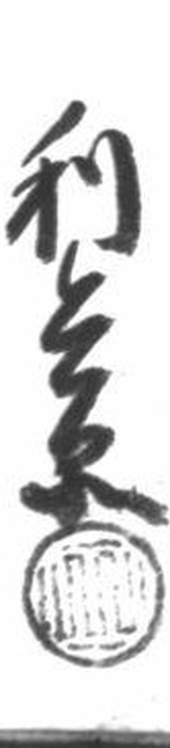利兵衛
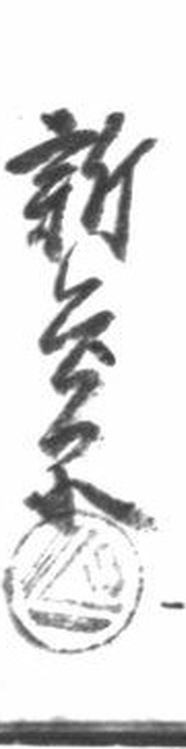新兵衛
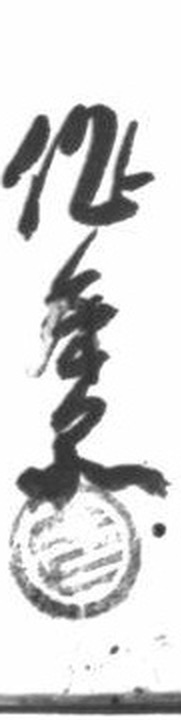作兵衛
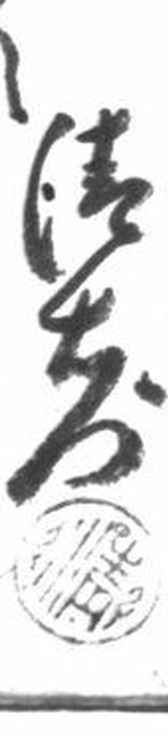清右衛門
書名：宝永弐酉五月火之用心護摩之灰御改帳証文
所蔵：福井県文書館 Fukui Prefectural Archives
